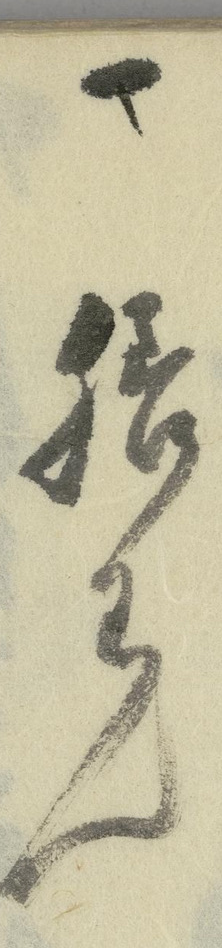一膳わん
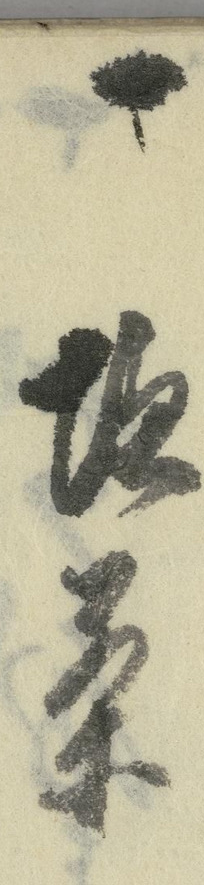一塩茶
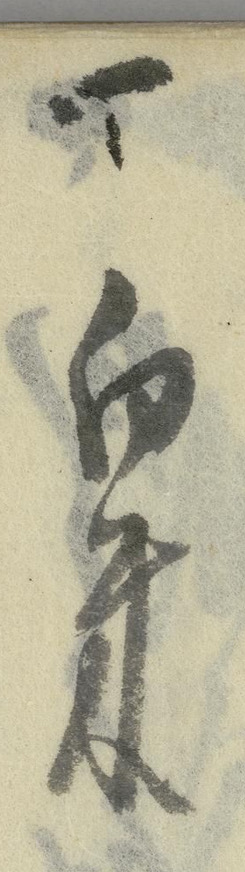一白米
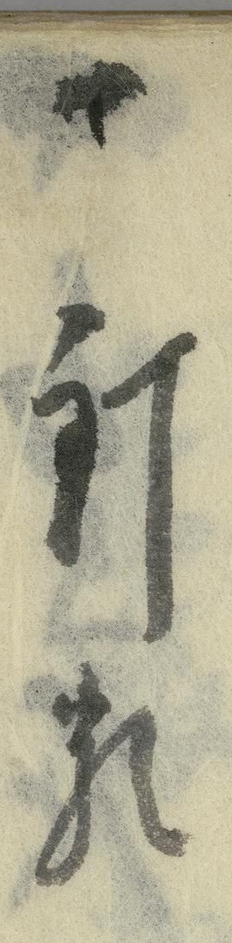一釘類

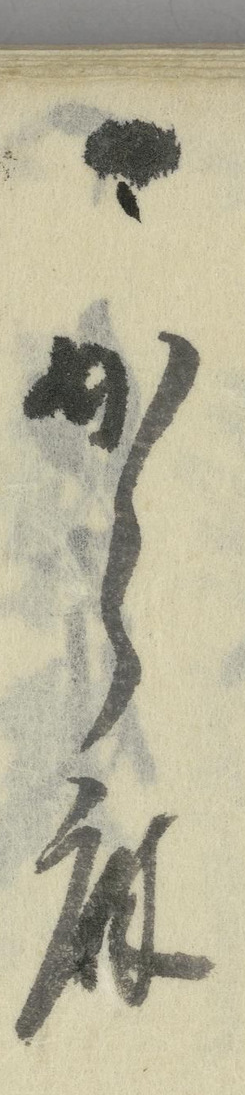一から麻

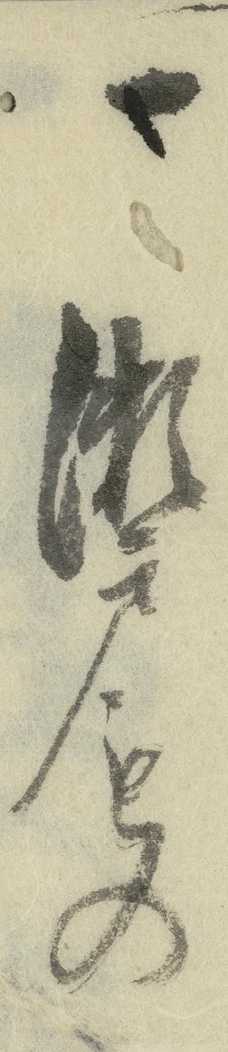一瀬戸もの
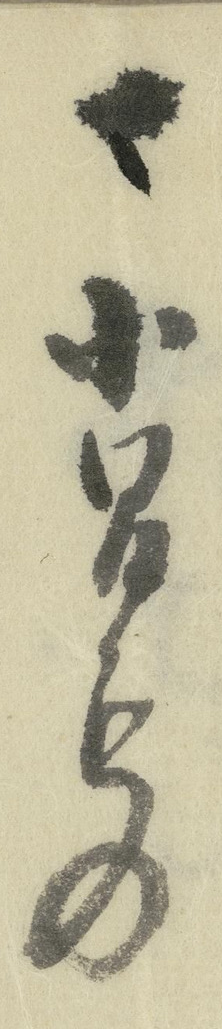一小間もの
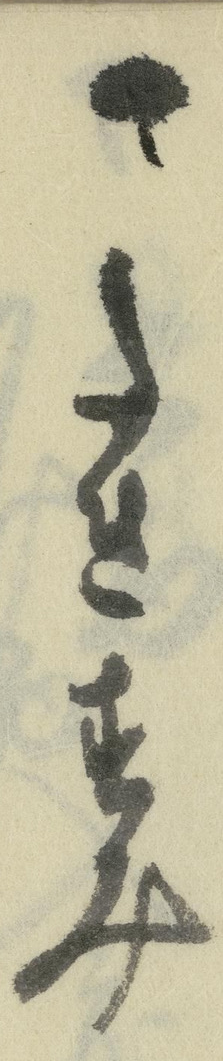一たきすみ
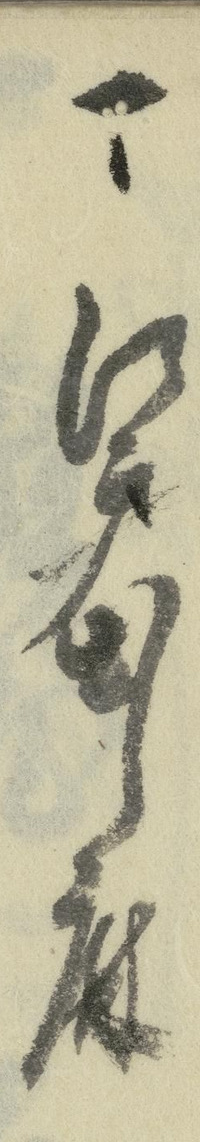一江戸出し麻
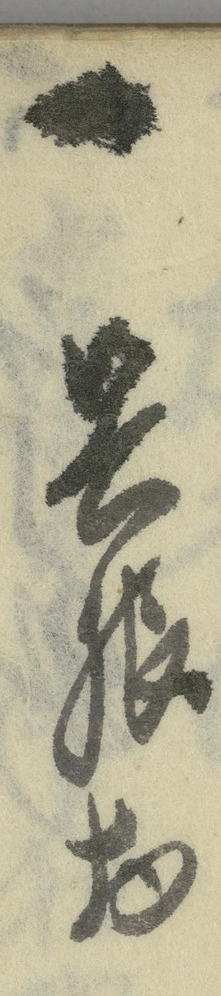一呉服物

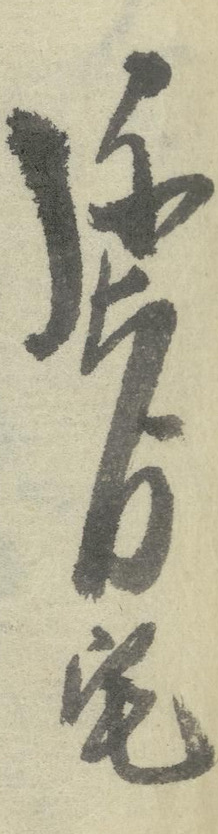弥右衛門宅
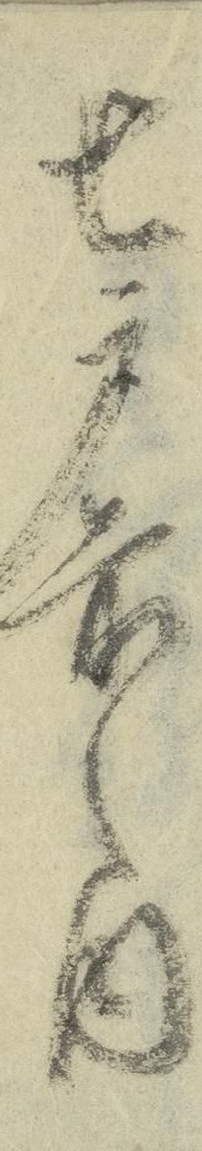七戸前之内
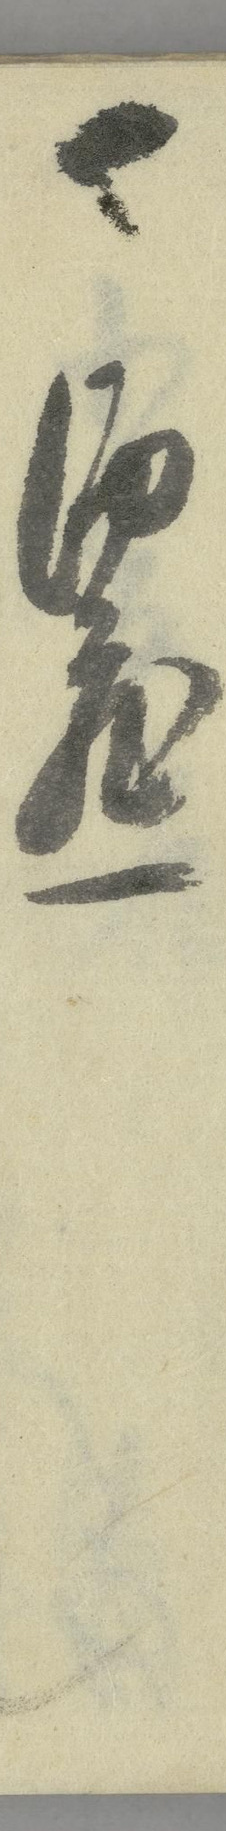一酒倉一
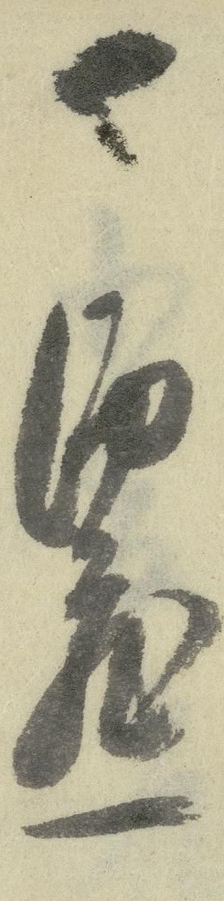一酒倉一
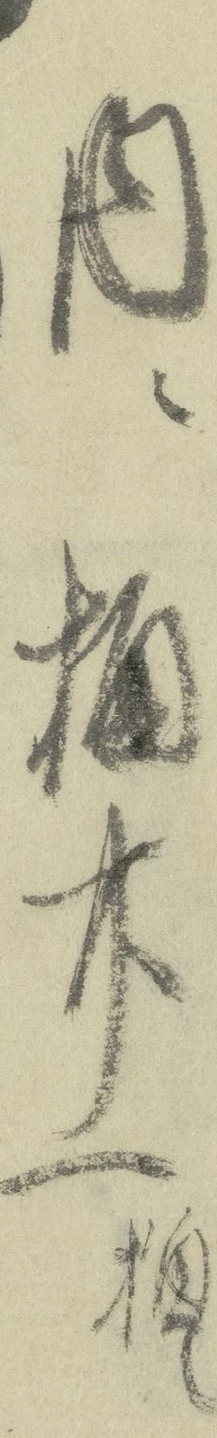内二桶廿一樽
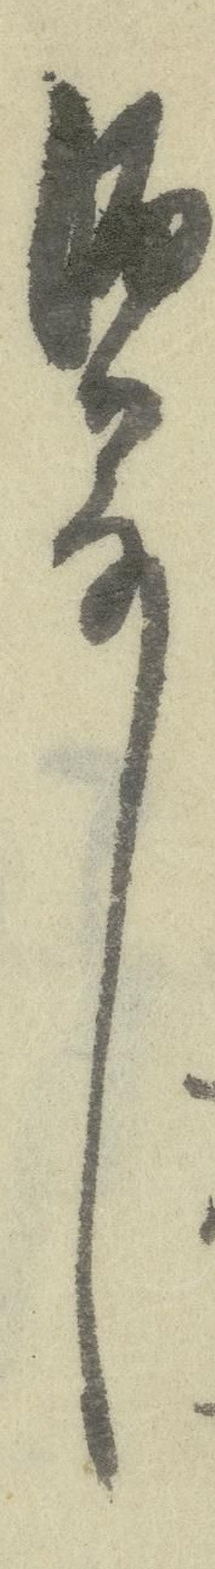酒なし
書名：天明淺間噴火ニ関スル書類
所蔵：東京大学地震研究所図書室 Earthquake Research Institute Library, The University of Tokyo, JAPAN
